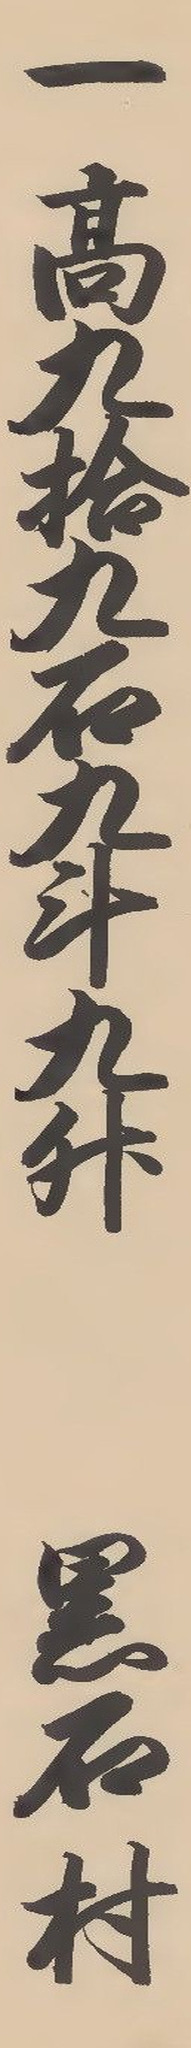一高九拾九石九斗九升黒石村
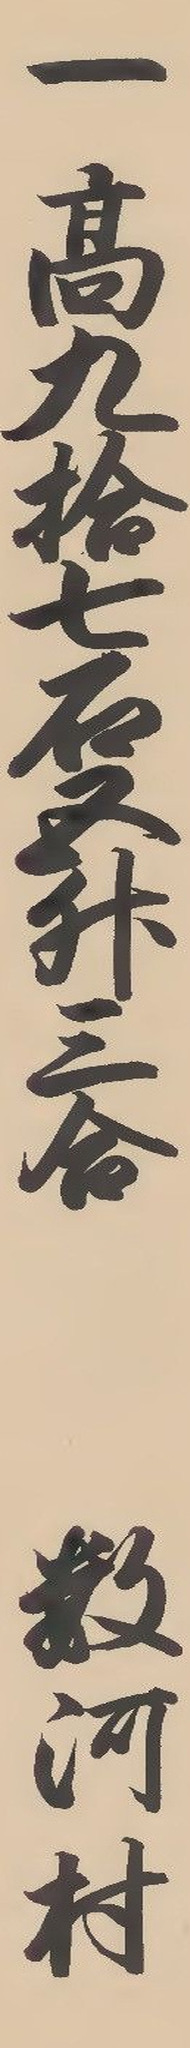一高九拾七石五升三合数河村
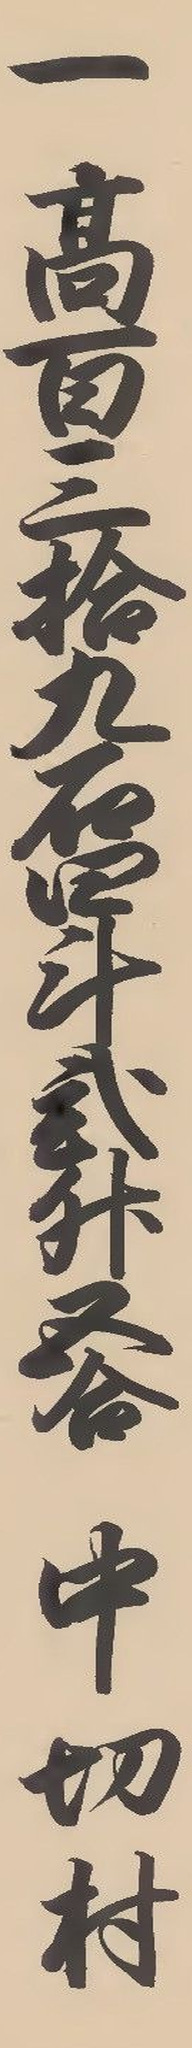一高百三拾九石四斗弐升五合中切村
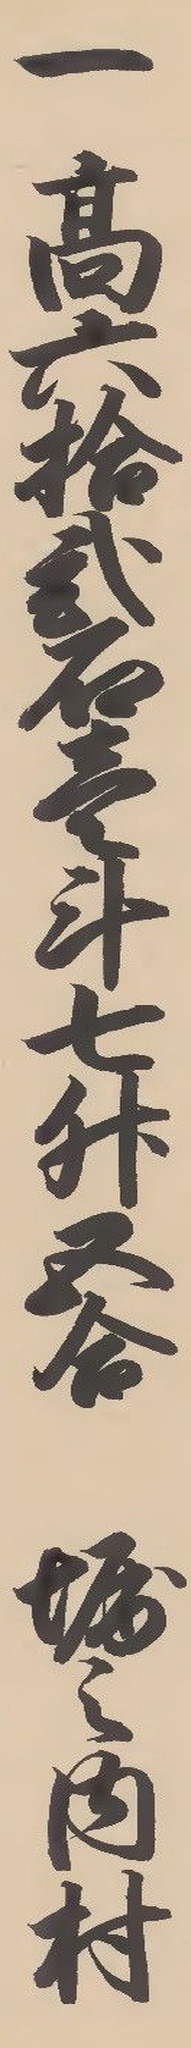一高六拾弐石壱斗七升五合堀之内村
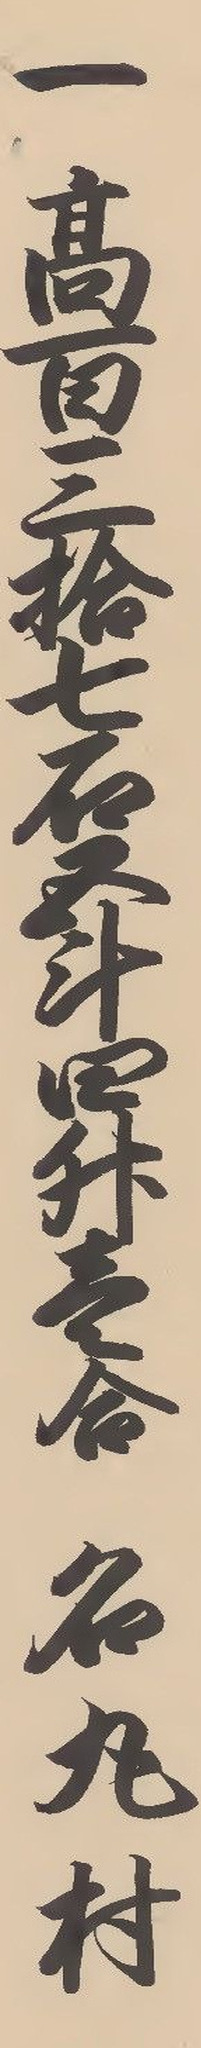一高百三拾七石五斗四升壱合名丸村
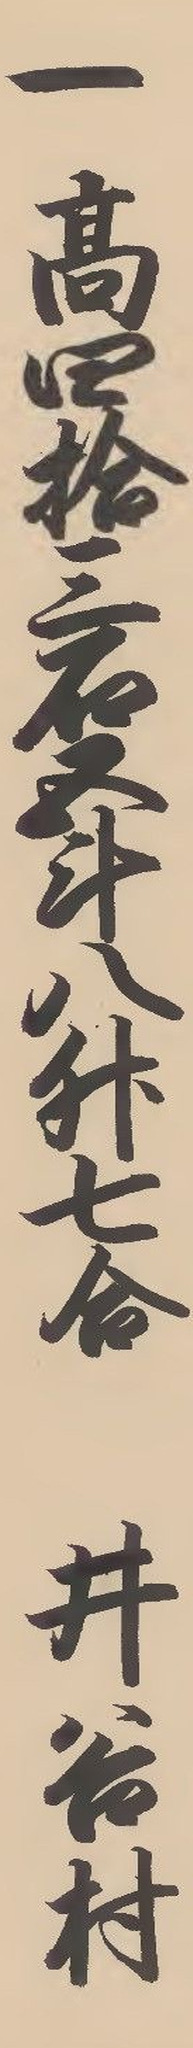一高四拾三石五斗八升七合井谷村

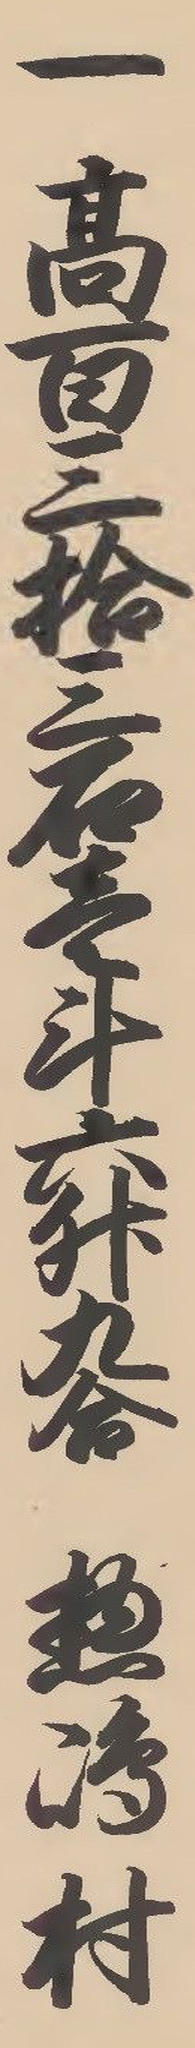一高百三拾三石壱斗六升九合惣島村
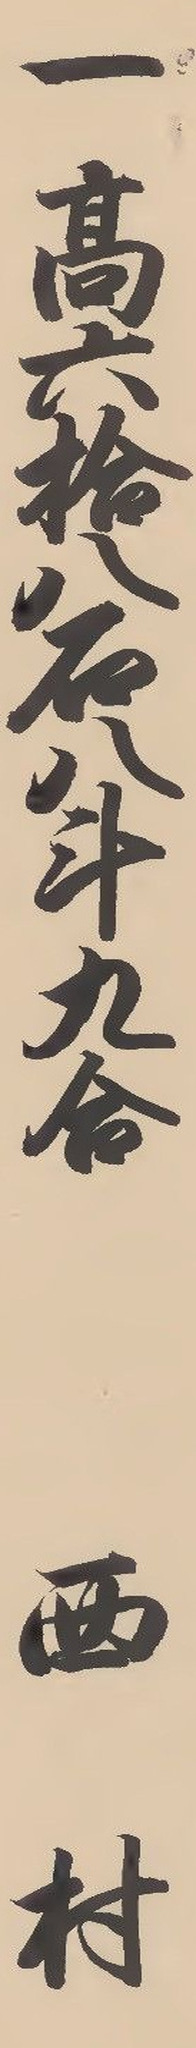一高六拾八石八斗九合西村
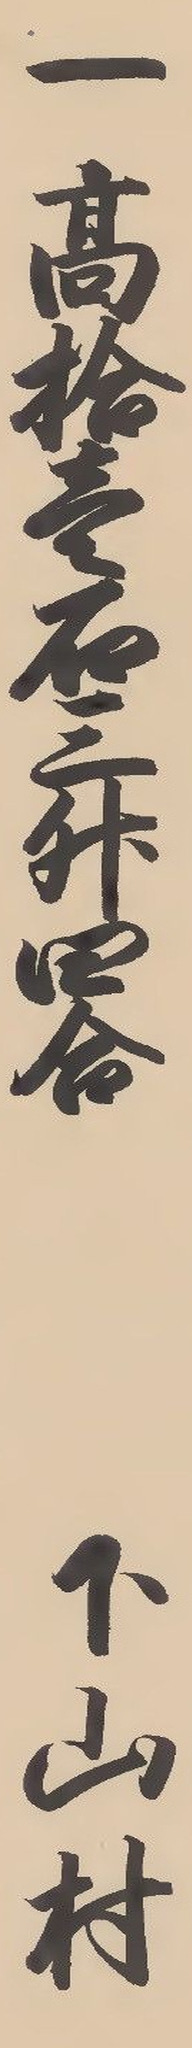一高拾壱石三升四合下山村
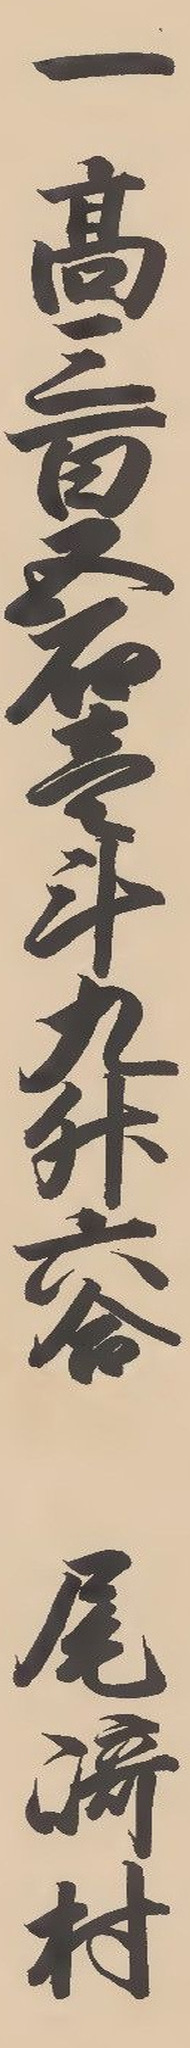一高三百五石壱斗九升六合尾崎村
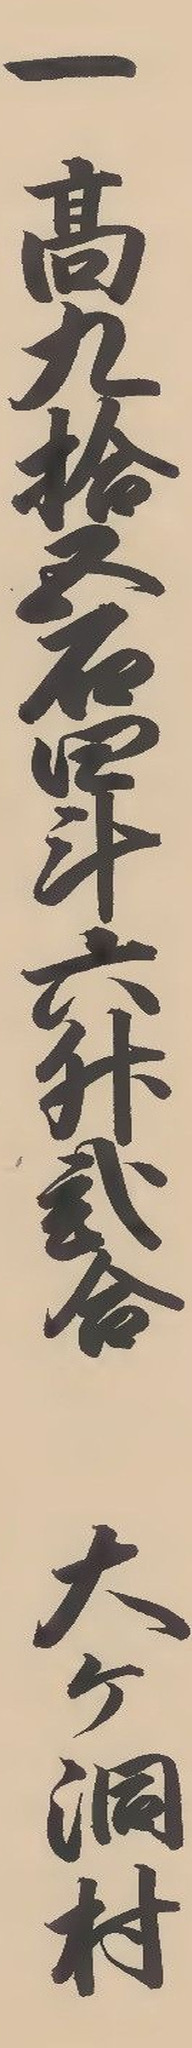一高九拾五石四斗六升弐合大ヶ洞村
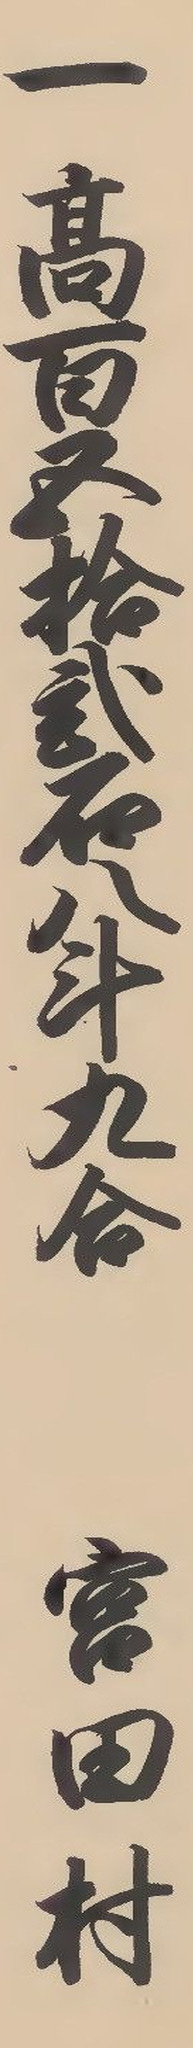一高百五拾弐石八斗九合宮田村
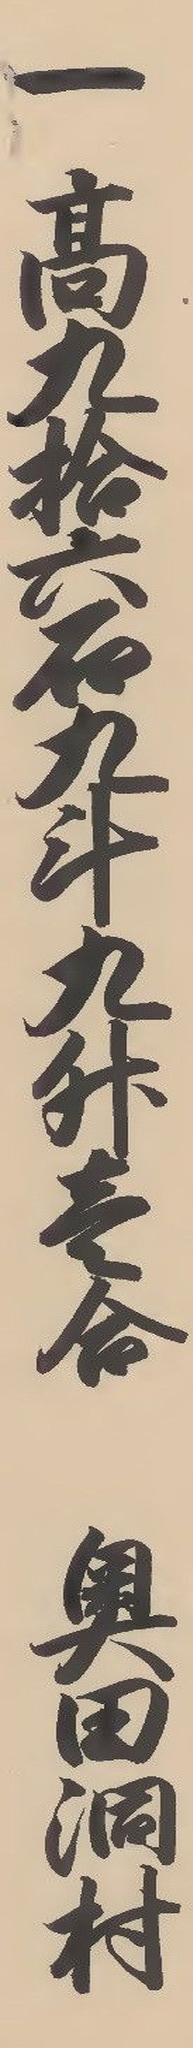一高九拾六石九斗九升壱合奥田洞村
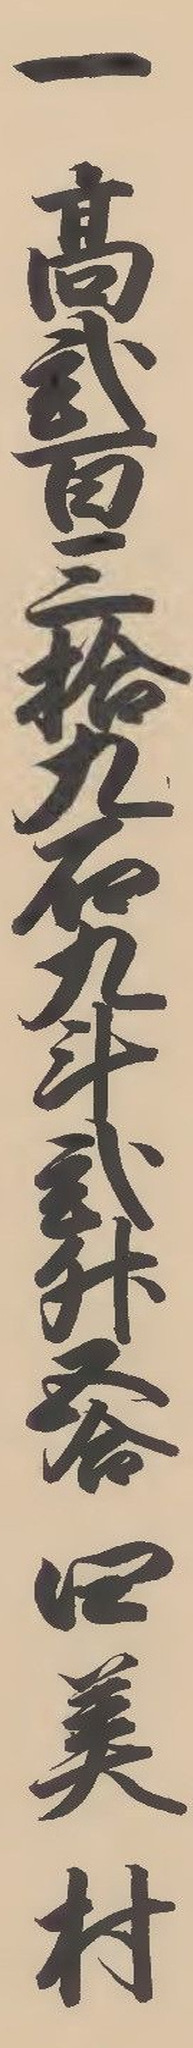一高弐百三拾九石九斗弐升五合四美村

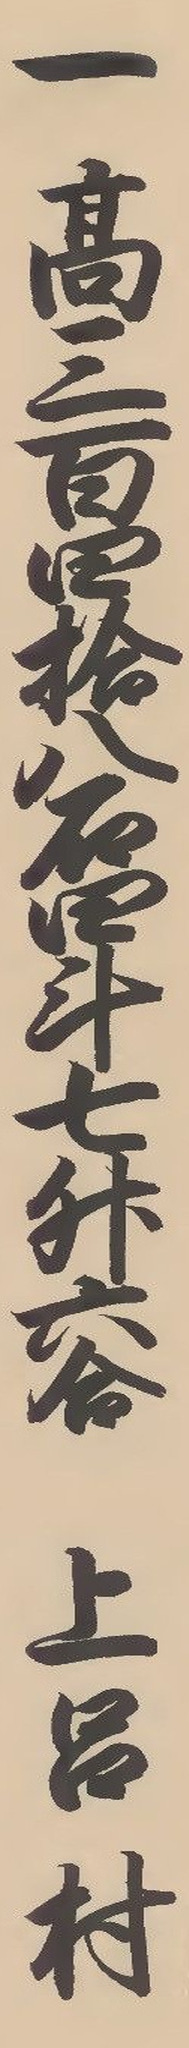一高三百四拾八石四斗七升六合上呂村
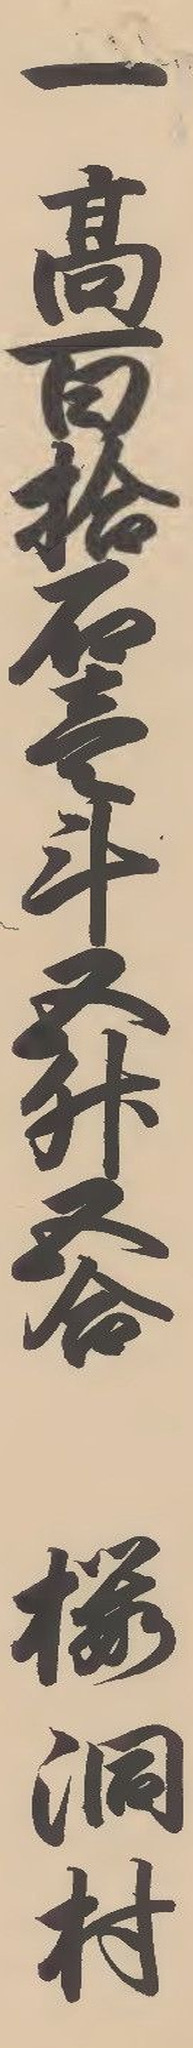一高百拾石壱斗五升五合桜洞村
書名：飛騨国郷帳
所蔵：国立公文書館 National Archives of Japan
